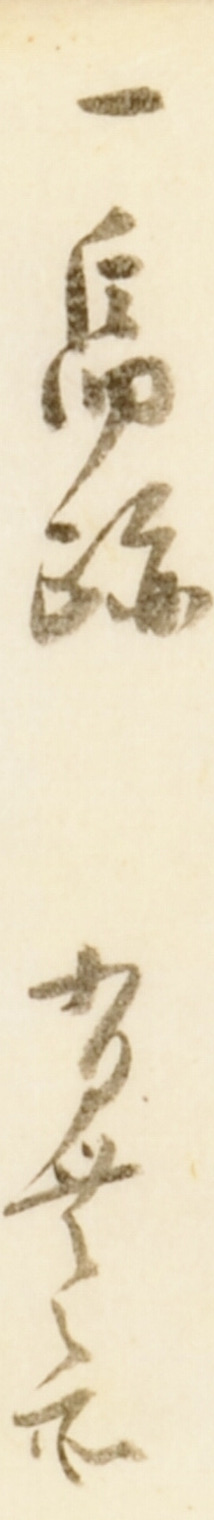一舊＝跡有無之所
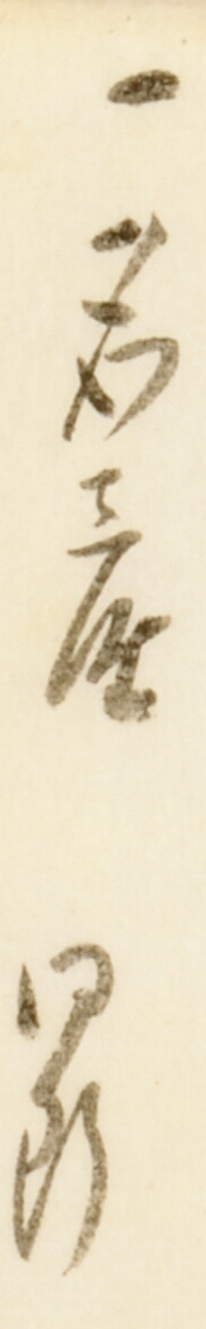一名産同断
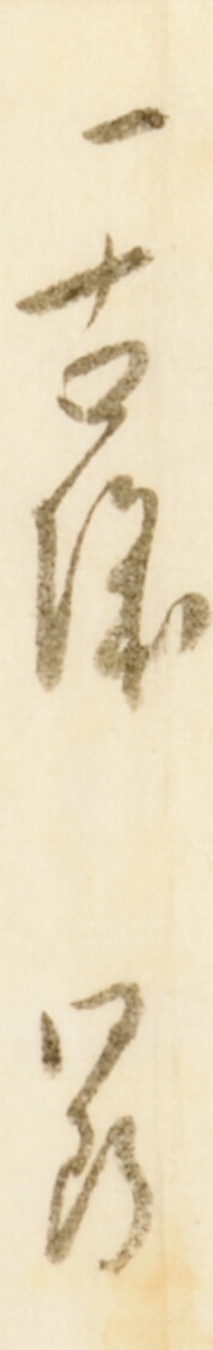一古城同断
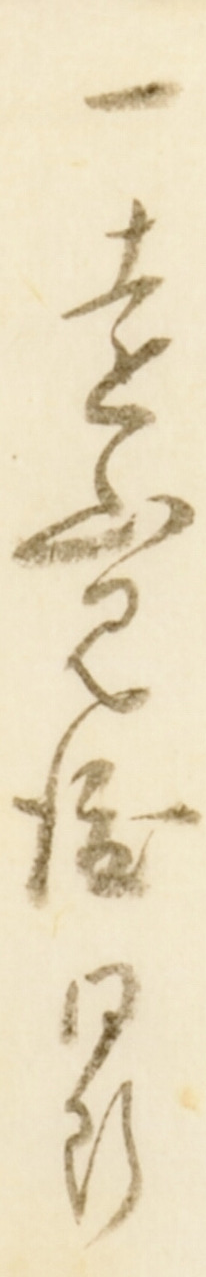一遠山見渡同断
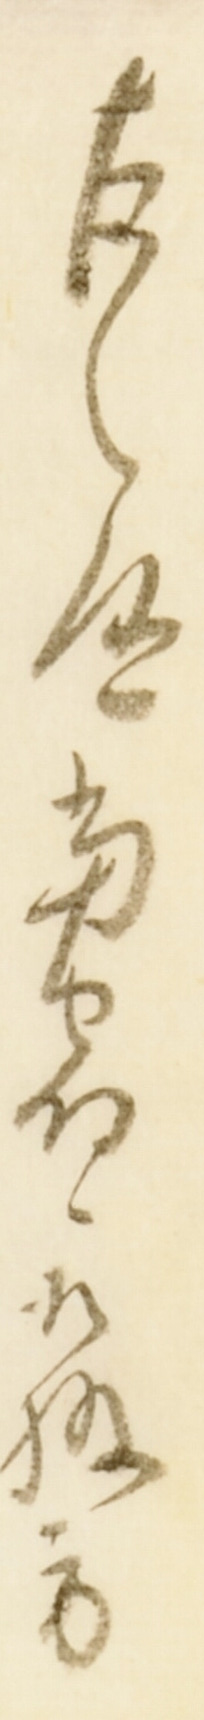右之通当宿之取扱方
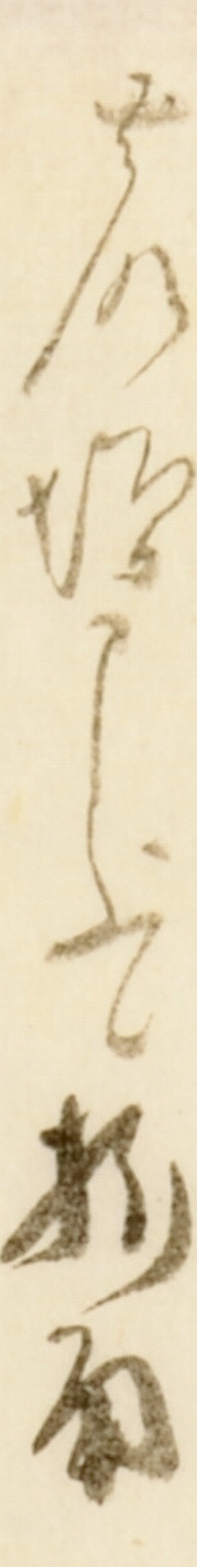荒増申上候折角
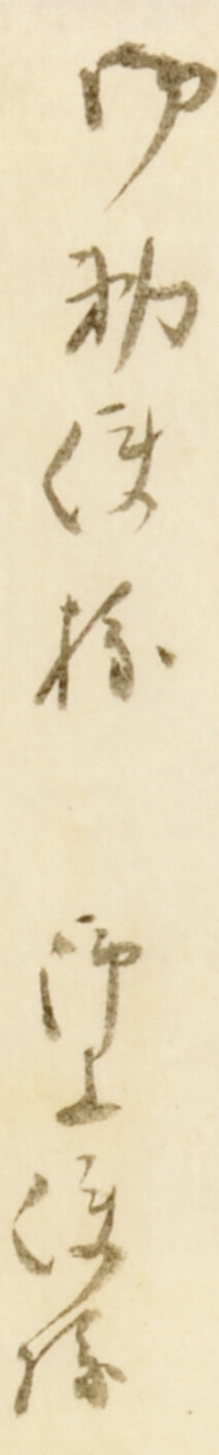御勅使様御上使様
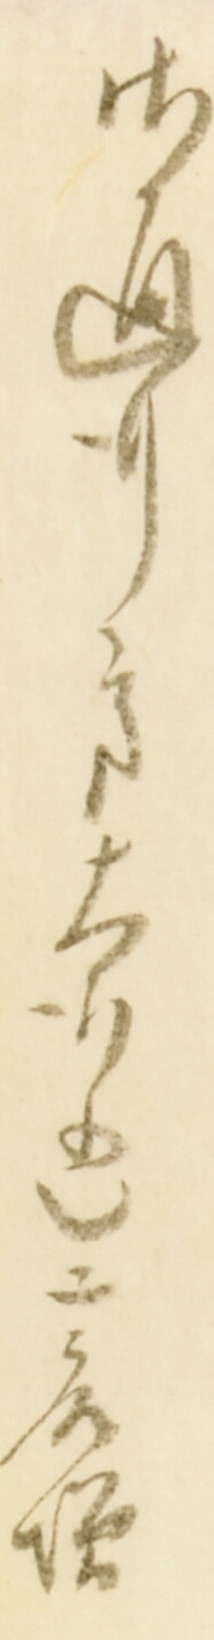御通行方大取込荒増
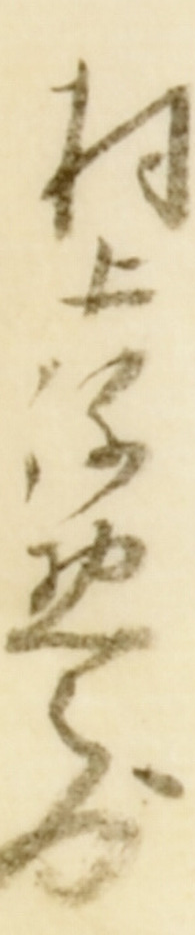村上弥惣右衛門

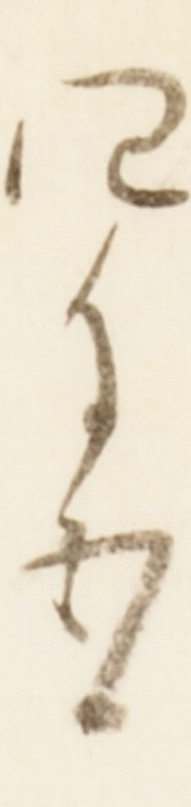四月五日
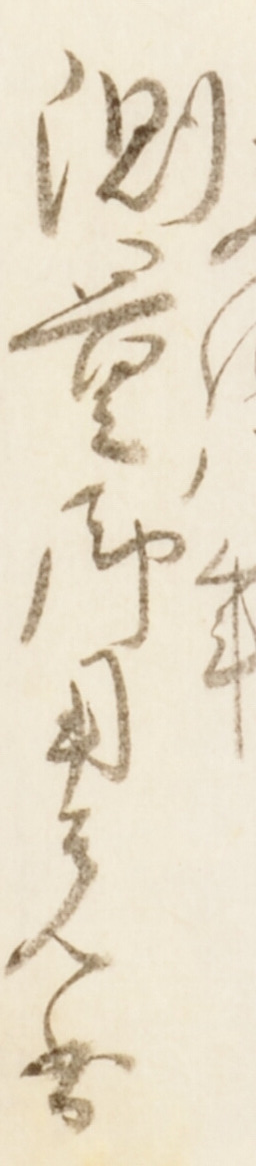測量御用覚書
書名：（覚）
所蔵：伊那市立高遠町図書館・合同会社AMANE
